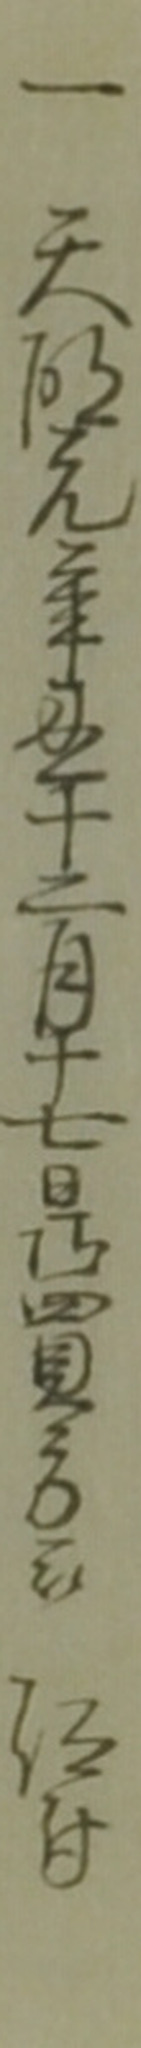一天明元辛丑十二月十七日御買方被仰付

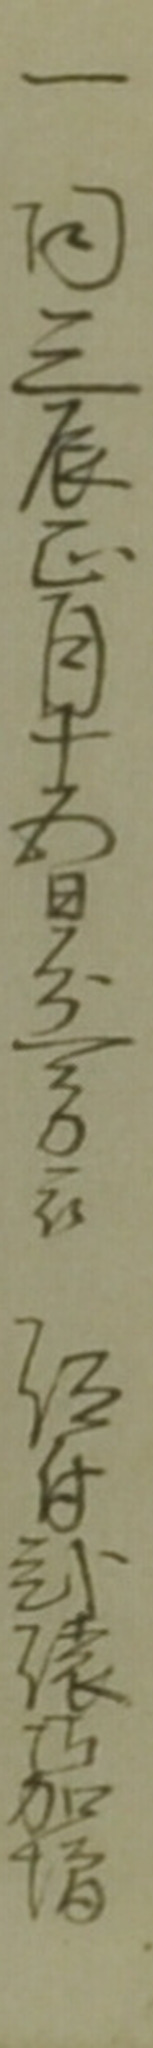一同三辰正月十五日分一方被仰付弐俵御加増
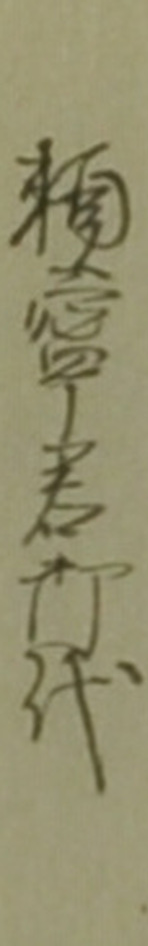頼寧君御代
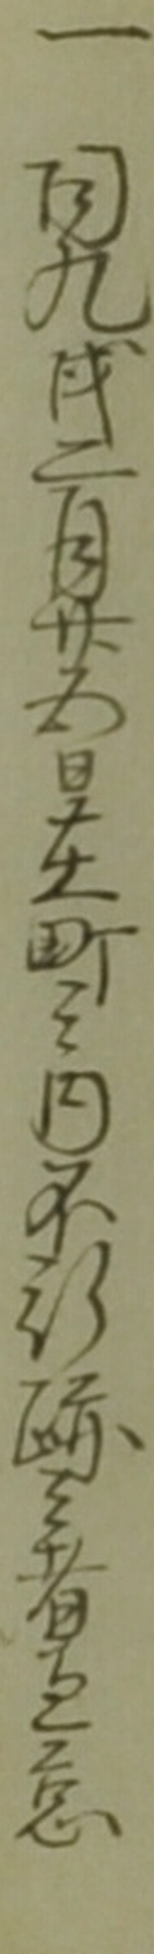一同九戌二月廿五日在町之内不行跡之者過怠

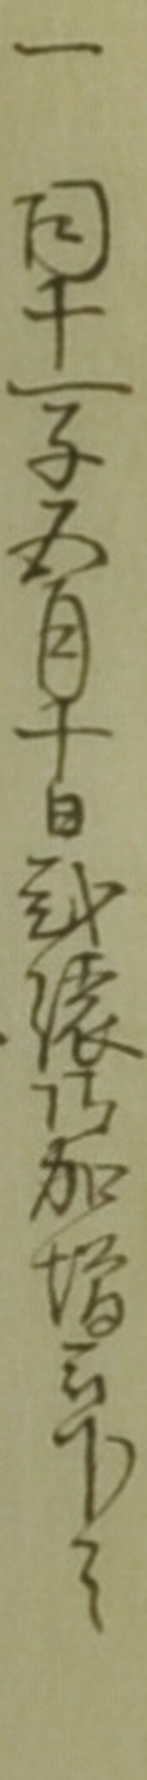一同十一子五月十日弐俵御加増被下之
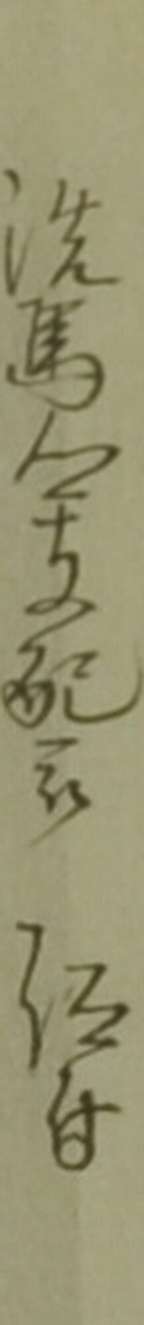洗馬郷支配被仰付
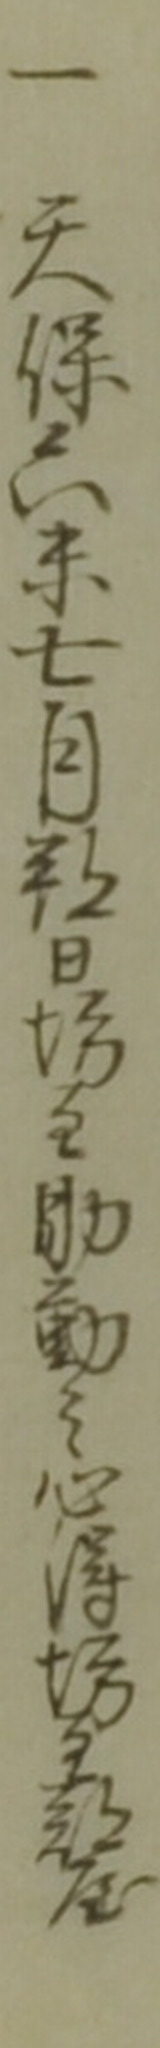一天保六未七月朔日坊主助勤之心得坊主部屋
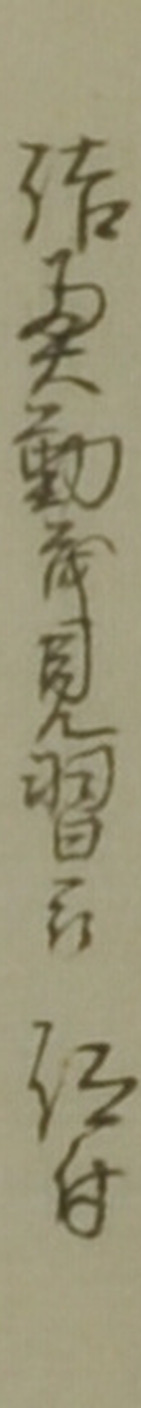詰奥勤茂見習被仰付
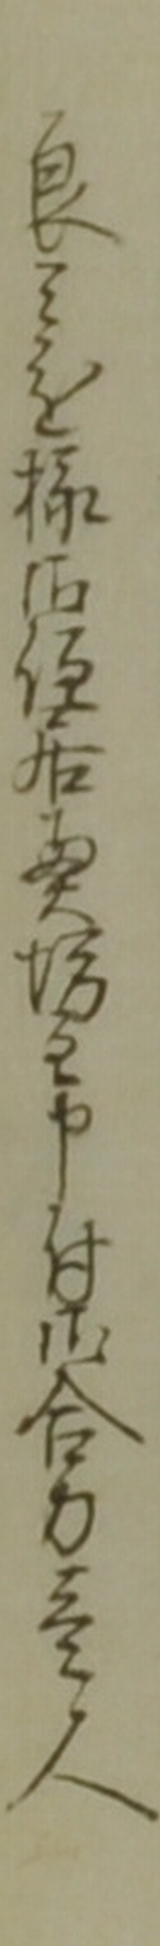良之進様御住居奥坊主申付御合力壱人
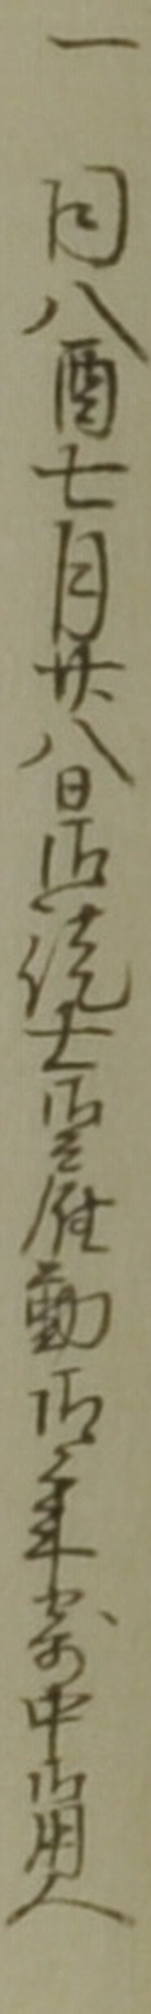一同八酉七月廿八日御徒士雇勤御年寄中御用人
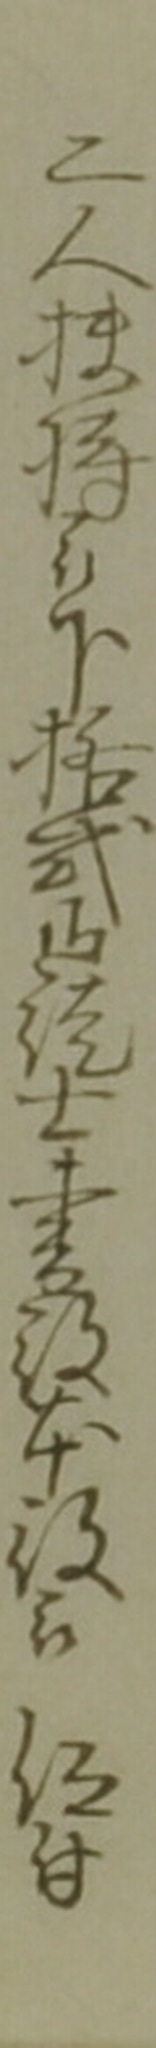二人扶持被下格式御徒士書役本役被仰付
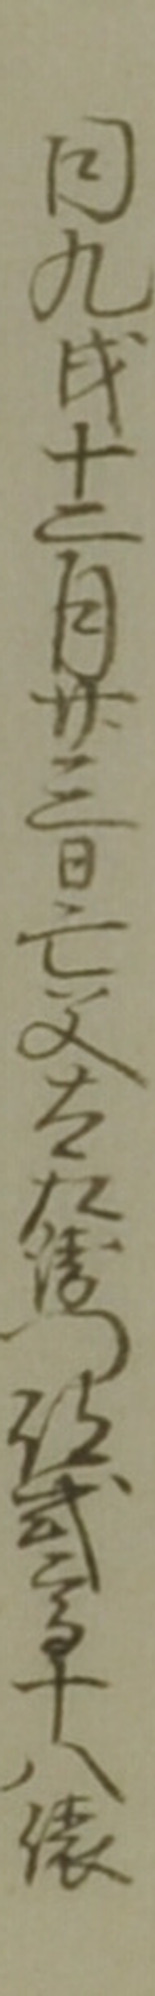一同九戌十二月廿三日亡父太左衛門跡式高十八俵
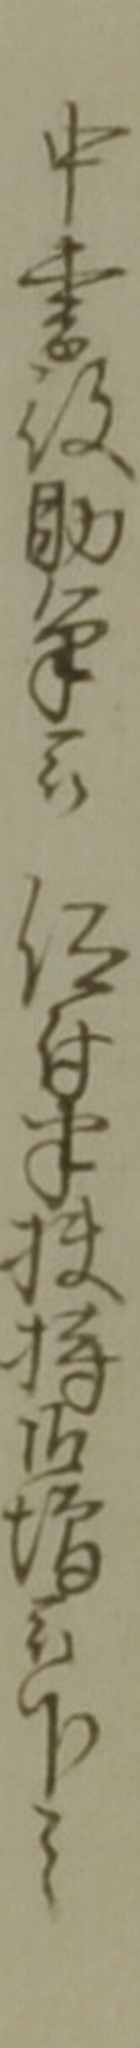中書役助筆被仰付半扶持御増被下之

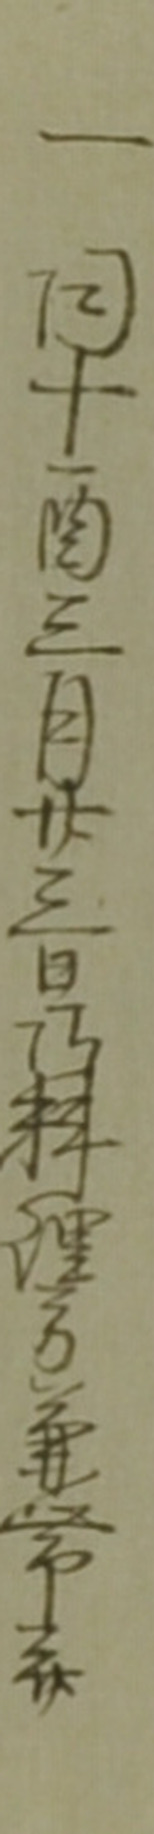一同十酉三月廿三日御料理方兼帯并

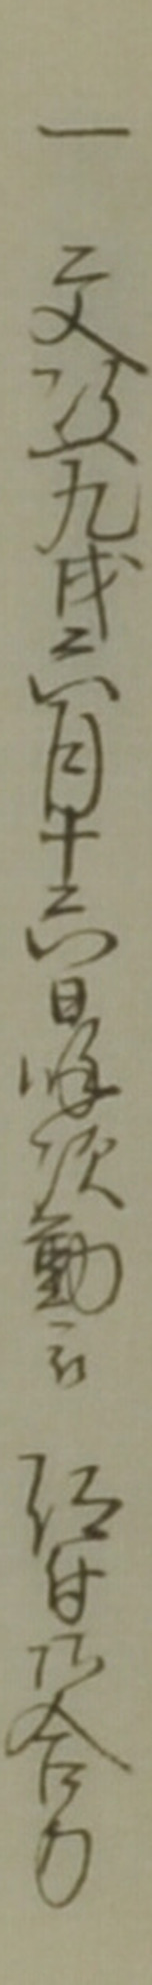一文政九戌六月十六日呼次勤被仰付御合力
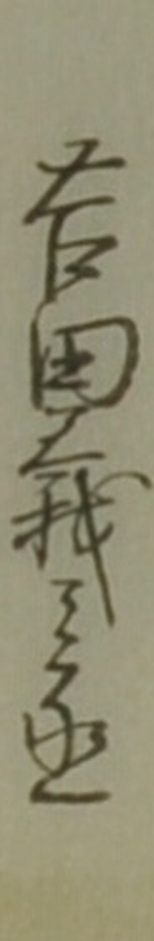吉田義之丞
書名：無足諸士勤仕録（三）
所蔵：伊那市立高遠町図書館・合同会社AMANE
